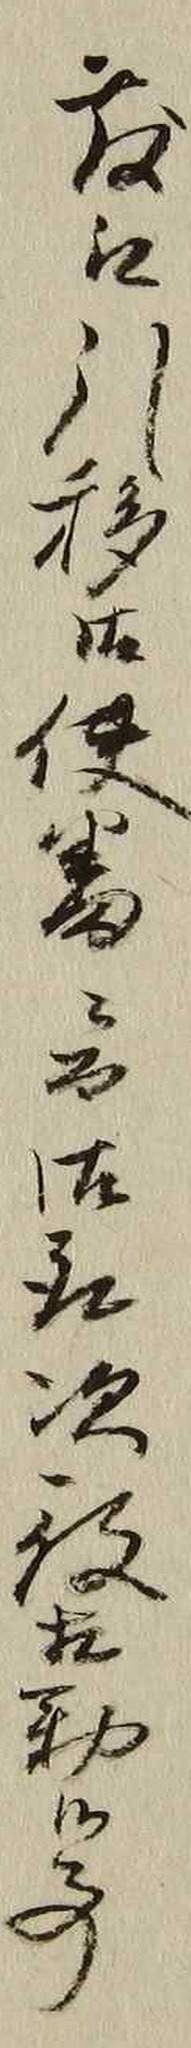敷江引移御使番ニ而御取次役相勤候事
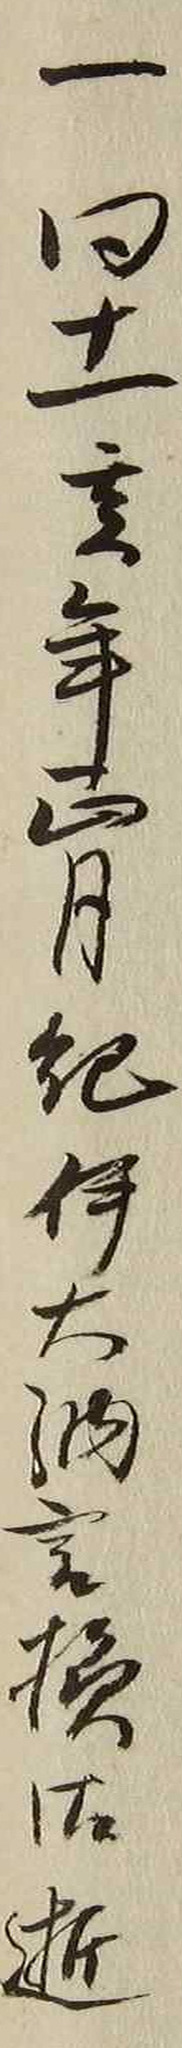一同十一亥年正月紀伊大納言様御逝
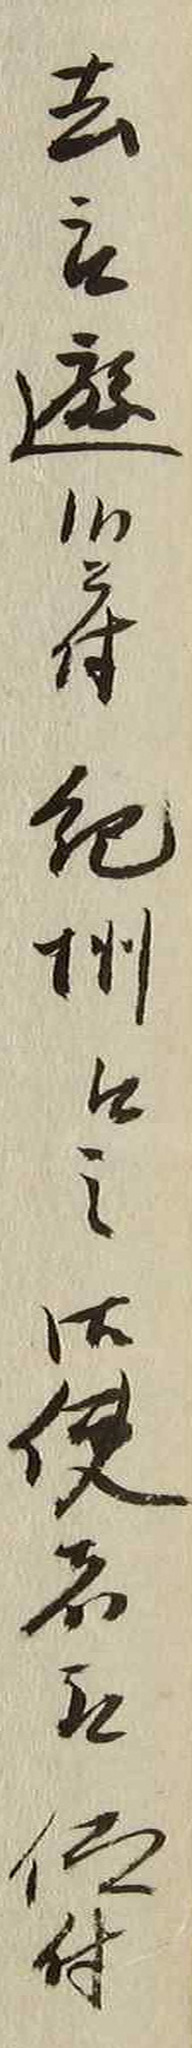去被遊候ニ付紀州江之御使者被仰付
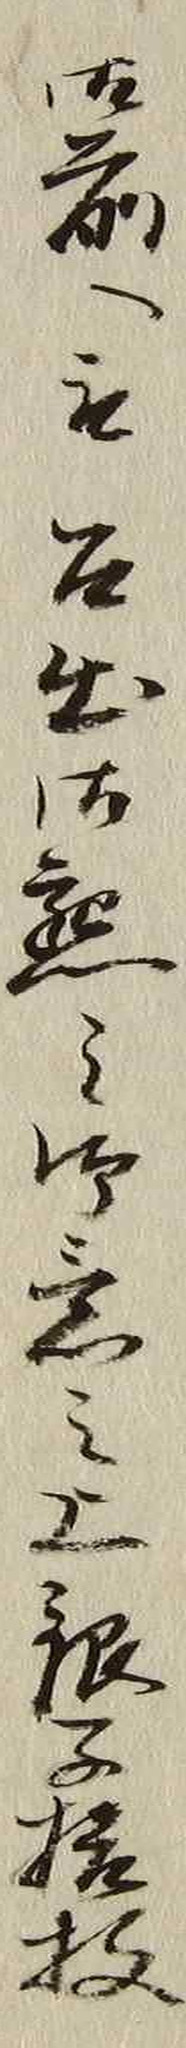御前へ被召出御懇之御意之上銀子拾枚
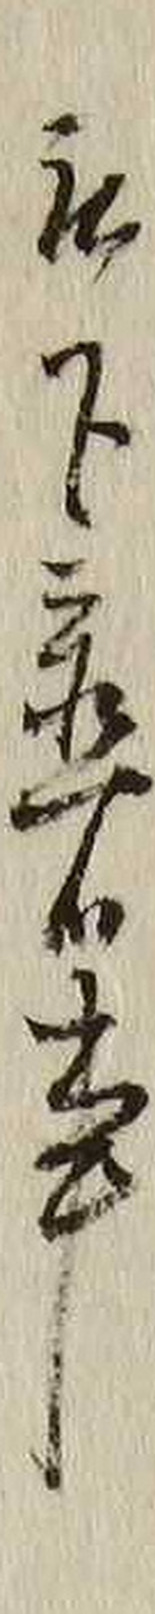被下置候事
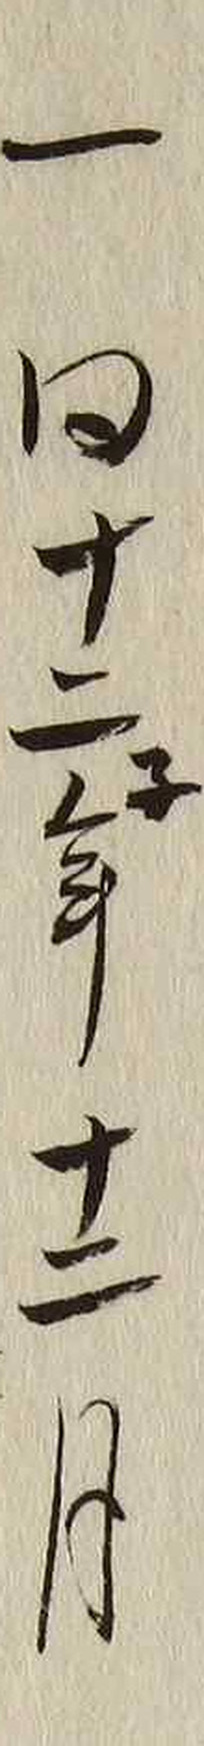一同十二子年十二月
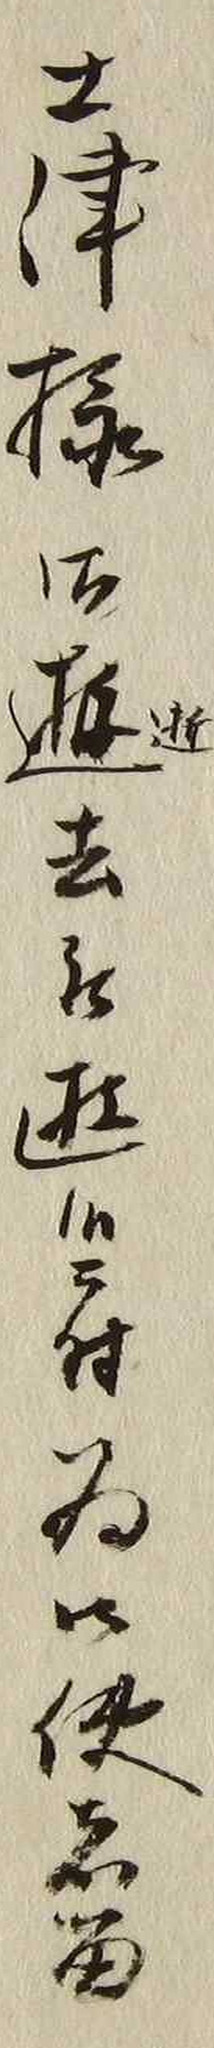士津様御遊去被遊候ニ付為御使者留
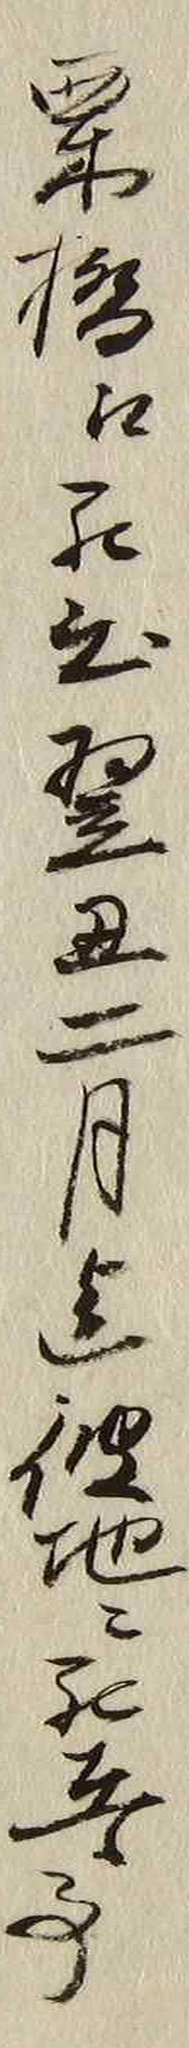栗橋江罷出翌丑二月迄彼地ニ罷在候事
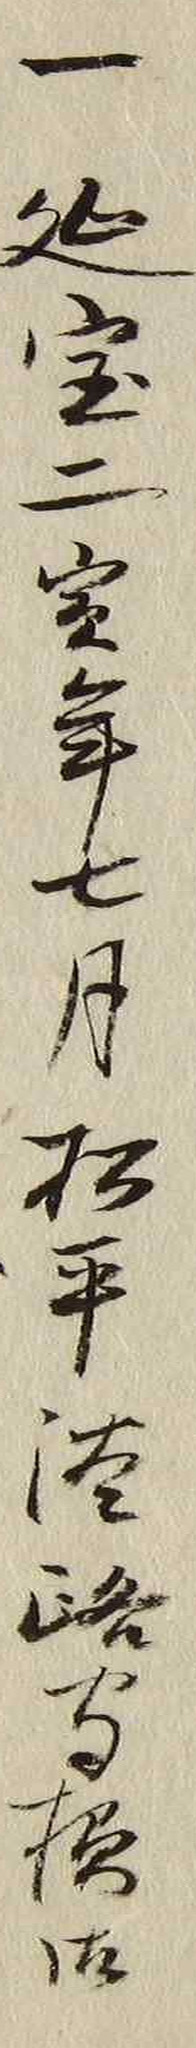一延宝二寅年七月松平淡路守様御
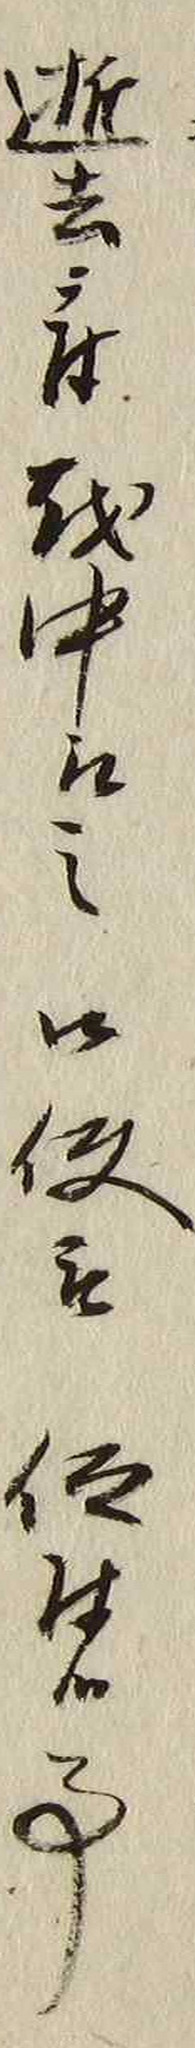逝去ニ付越中江之御使被仰付候事
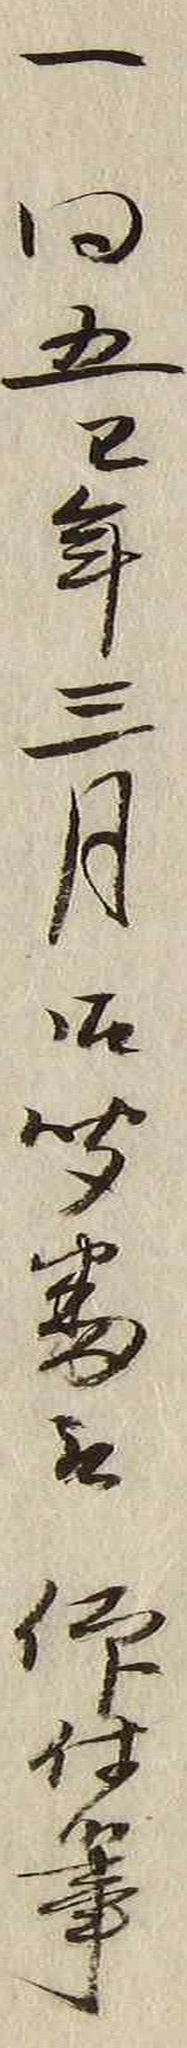一同五巳年三月御聞番被仰付候事
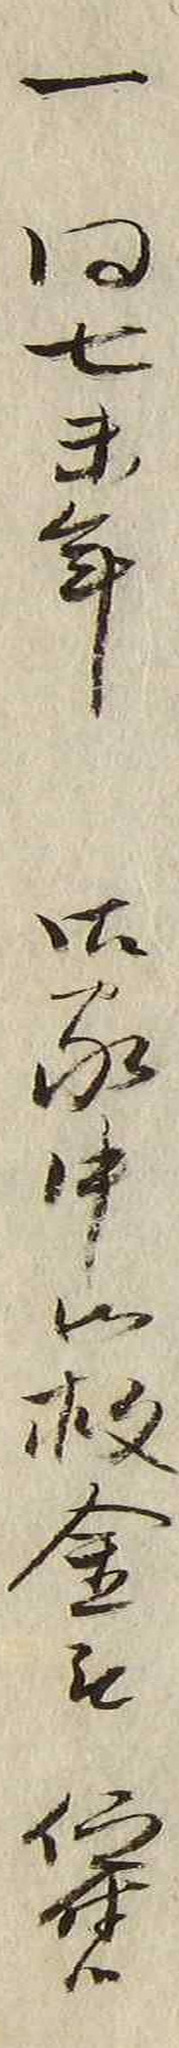一同七未年御家中御救金被仰付候

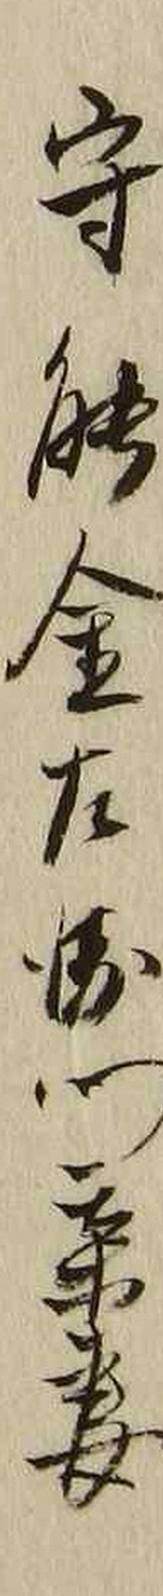女守能金左衛門某妻
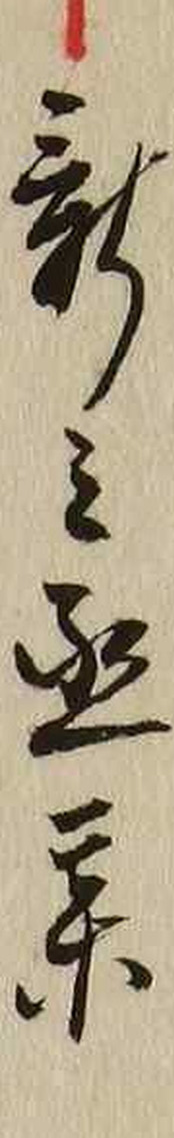新之丞某
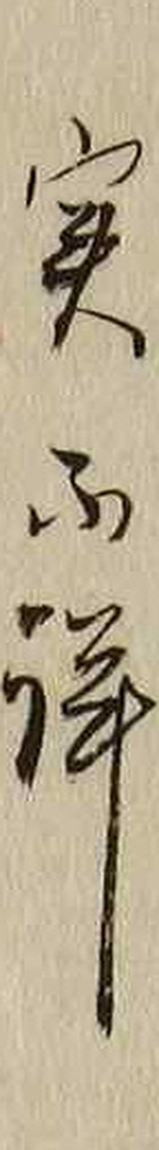実不詳
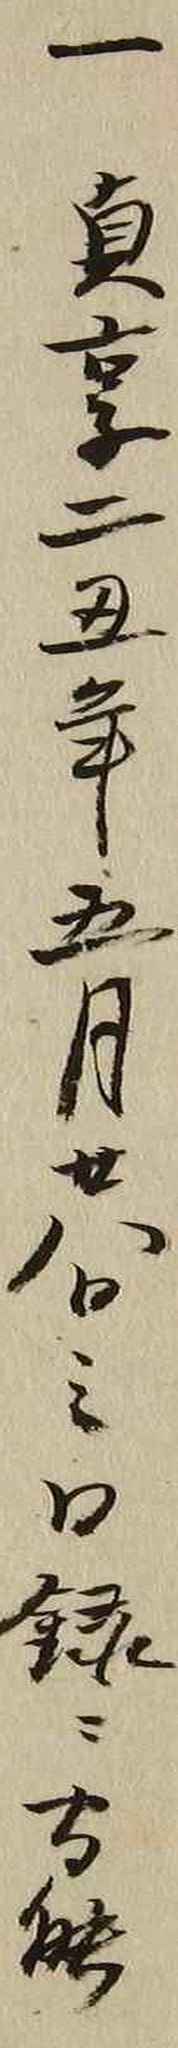一貞享二丑年五月廿八日之日録ニ守能
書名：諸士系譜　巻之345　も之部1
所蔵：会津若松市立会津図書館
